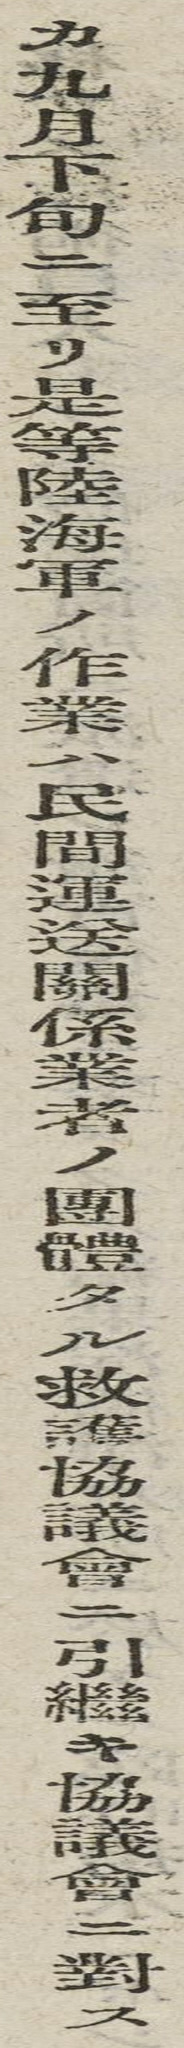カ九月下旬ニ至リ是等陸海軍ノ作業ハ民間運送関係業者ノ団体タル救護協議会ニ引継キ協議会ニ対ス
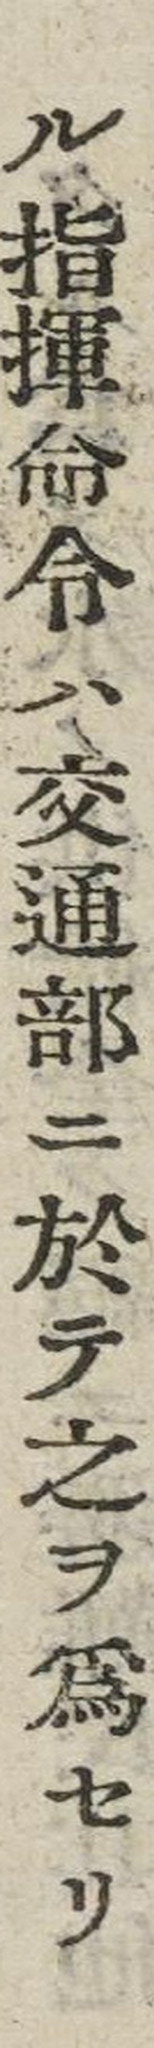ル指揮命令ハ交通部ニ於テ之ヲ為セリ
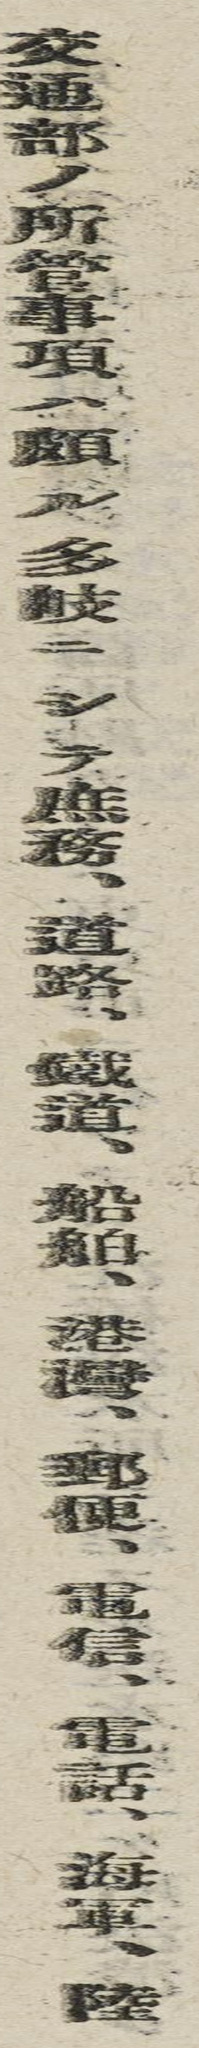交通部ノ所管事項ハ頗ル多岐ニシテ庶務、道路、鉄道、船舶、港湾、郵便、電信、電話、海軍、陸
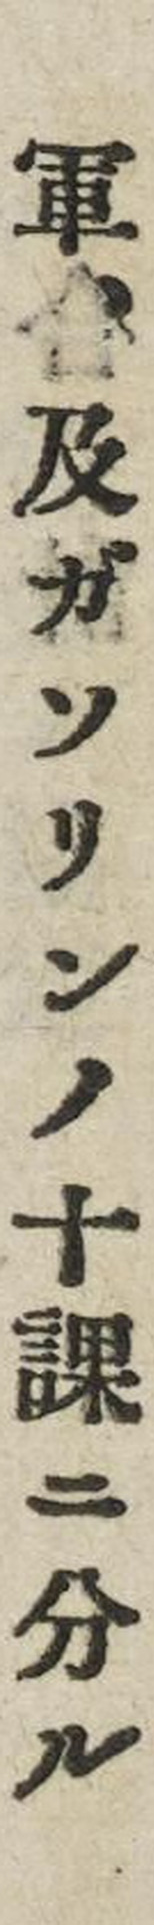軍、及ガソリンノ十課ニ分ル
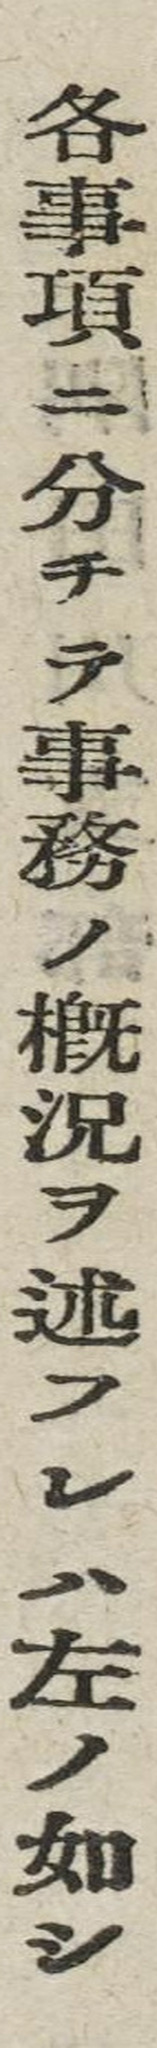各事項ニ分チテ事務ノ概況ヲ述フレハ左ノ如シ
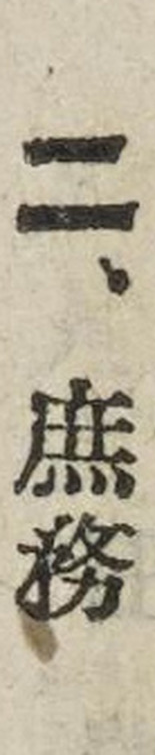ニ、庶務
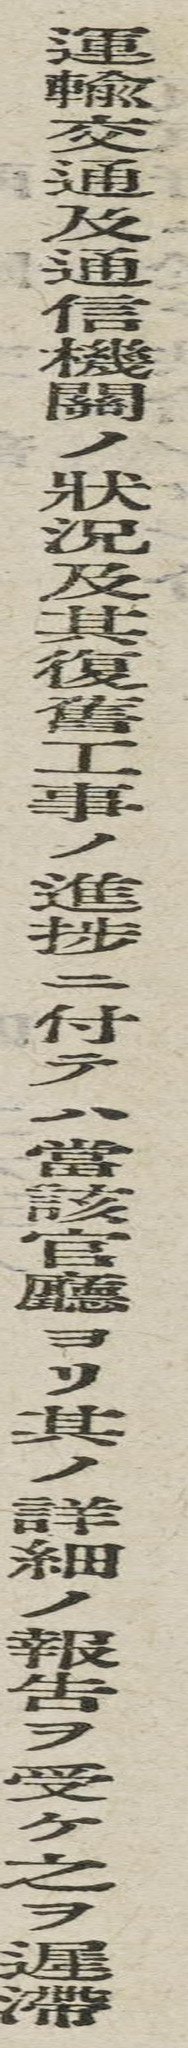運輸交通及通信機関ノ状況及其復旧工事ノ進捗ニ付テハ当該官庁ヨリ其ノ詳細ノ報告ヲ受ケ之ヲ遅滞
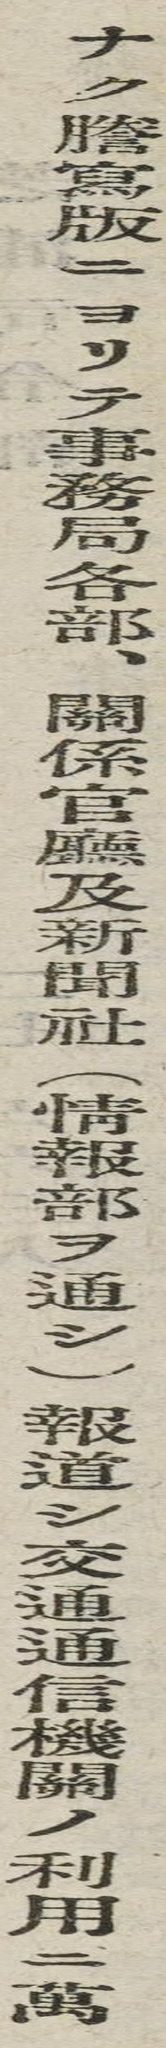ナク謄写版ニヨリテ事務局各部、関係官庁及新聞社報道シ交通通信機関ノ利用ニ万
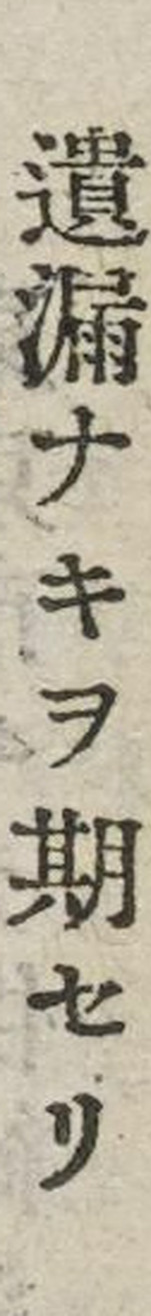遺憾ナキヲ期セリ
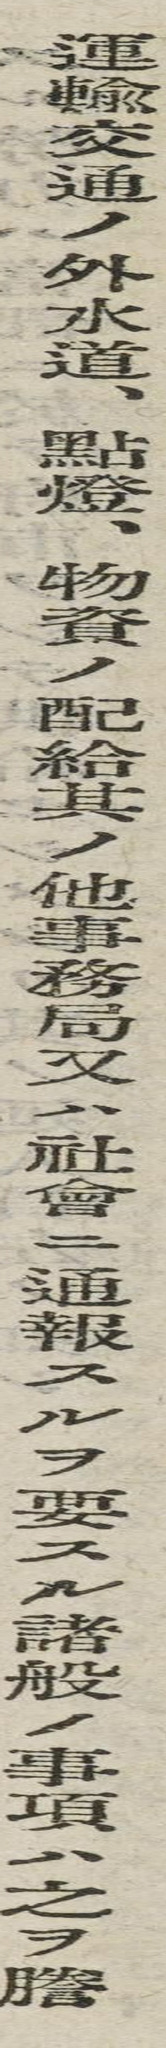運輸交通ノ外水道、点燈、物資ノ配給其ノ他事務局又ハ社会ニ通報スルヲ要スル諸般ノ事項ハ之ヲ謄
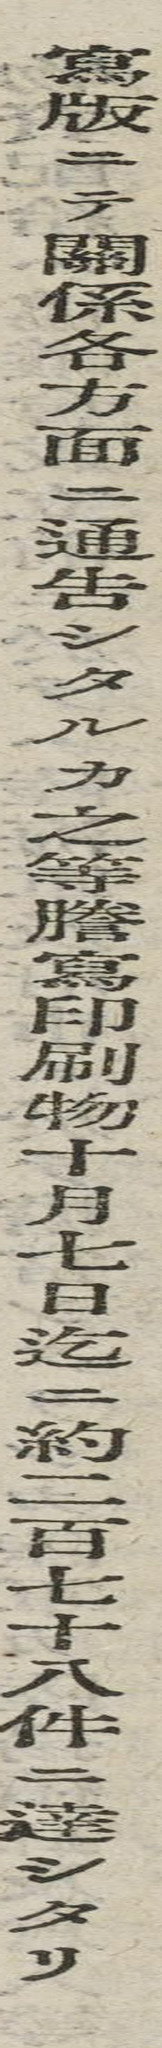写版ニテ関係各方面ニ通告シタルカ之等謄写版印刷物十月七日迄ニ約二百七十八件ニ達シタリ
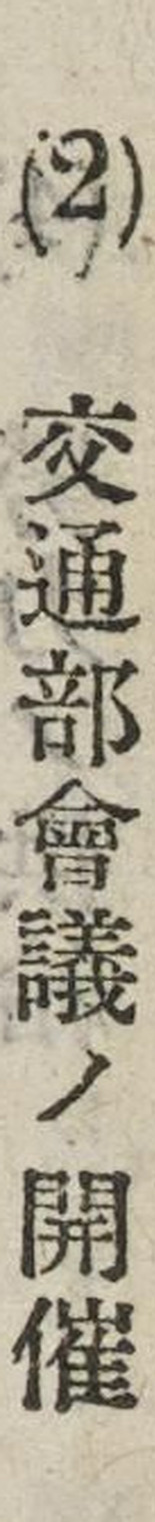⑵交通部会議ノ開催
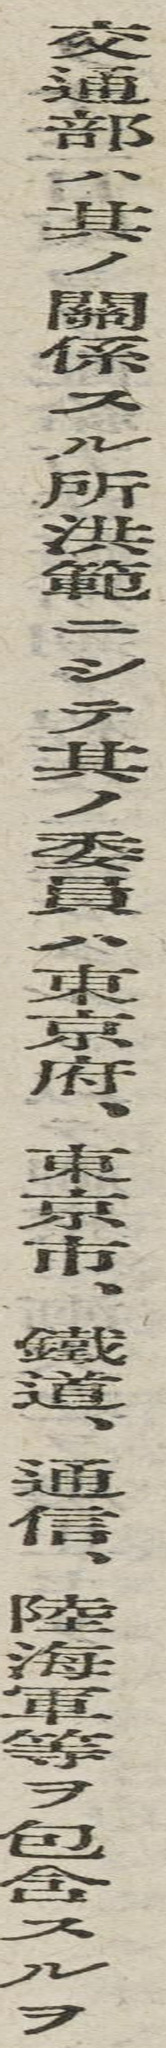交通部ハ其ノ関係スル所洪範ニシテ其ノ委員ハ東京府、東京市、鉄道、通信、陸海軍等ヲ包含スルヲ
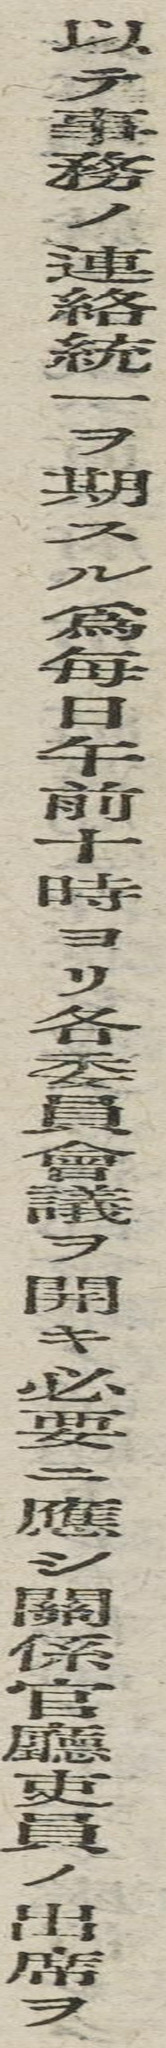以テ事務ノ連絡統一ヲ期スル為毎日午前十時ヨリ各委員会議ヲ開キ必要ニ応シ関係官庁吏員ノ出席ヲ
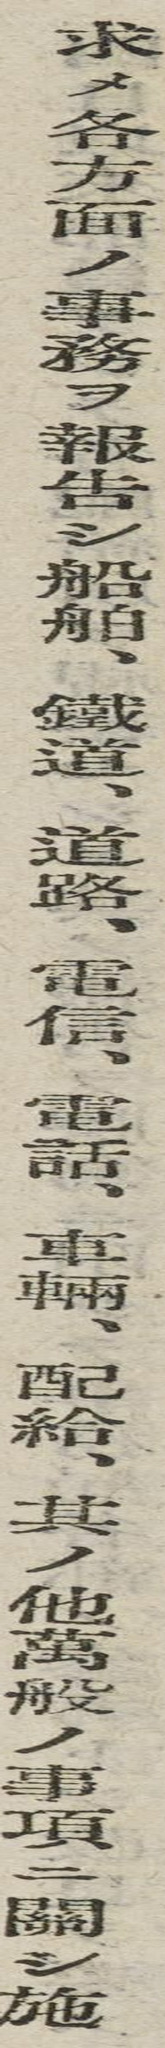求メ各方面ノ事務ヲ報告シ船舶、鉄道、道路、電信、電話、車輌、配給、其ノ他万般ノ事項ニ関シ施
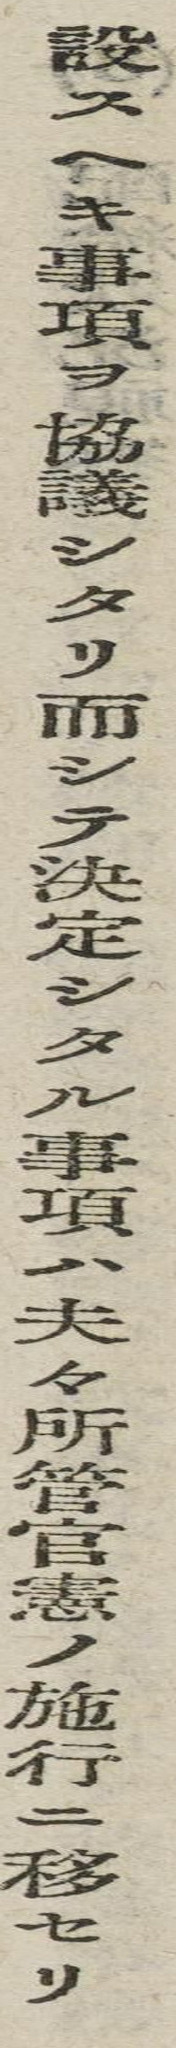設スヘキ事項ヲ協議シタリ而シテ決定シタル事項ハ夫々所管官憲ノ施行ニ移セリ
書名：震災被害状況並救護施設概要
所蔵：東京大学地震研究所図書室 Earthquake Research Institute Library, The University of Tokyo, JAPAN
